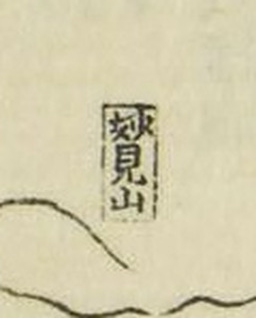妙見山

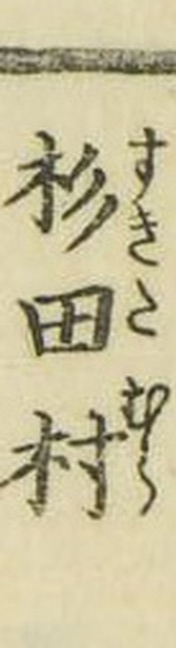杉田村
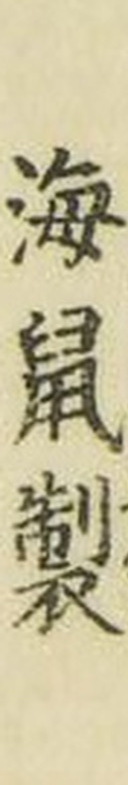海鼠製

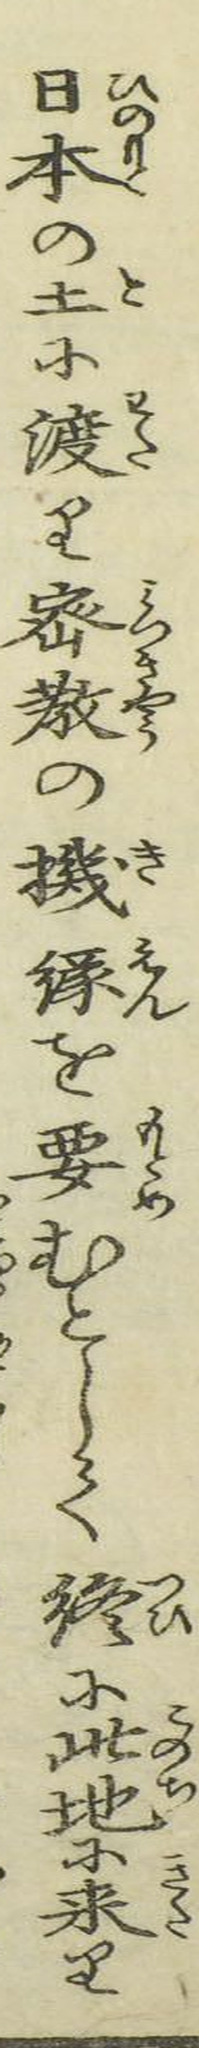日本の土に渡り密教の機緣を要むとして終に此地に来り
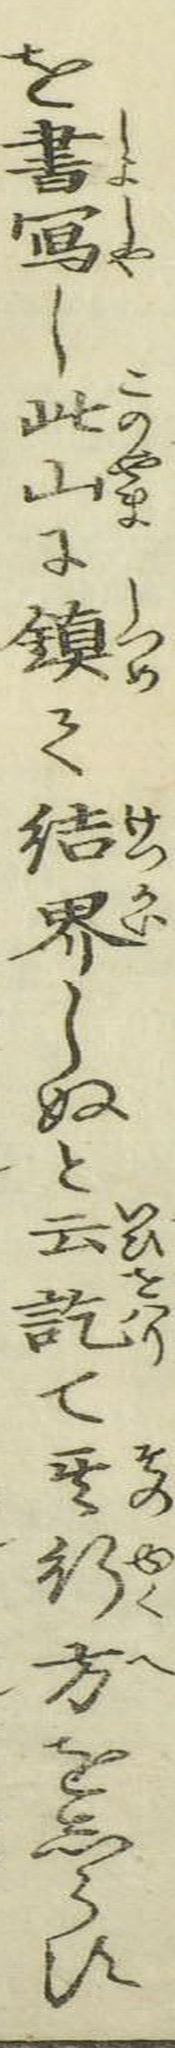を書冩し此山に鎮て結界しぬと云訖て其行方をしらす
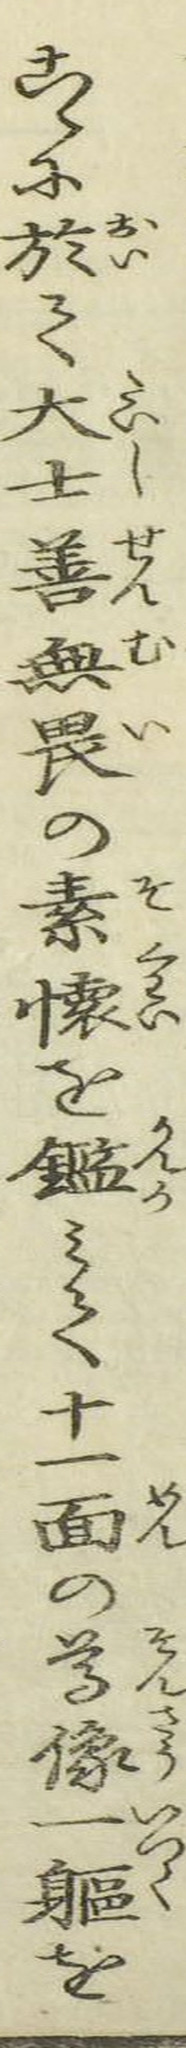こゝに於て大士善無畏の素懐を鑑みて十一面の尊像一軀を
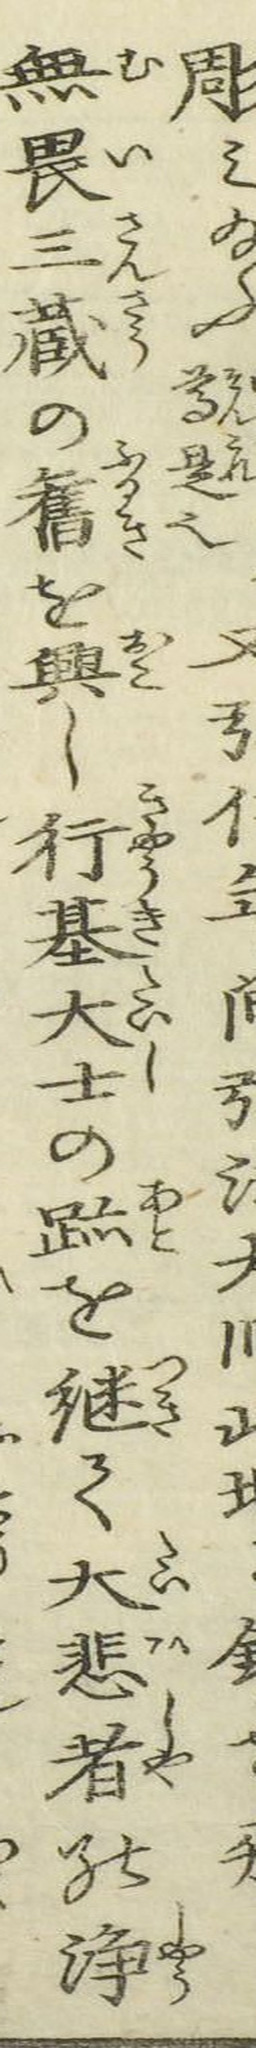無畏三蔵の𦾔を興し行基大士の跡を継て大悲者の浄
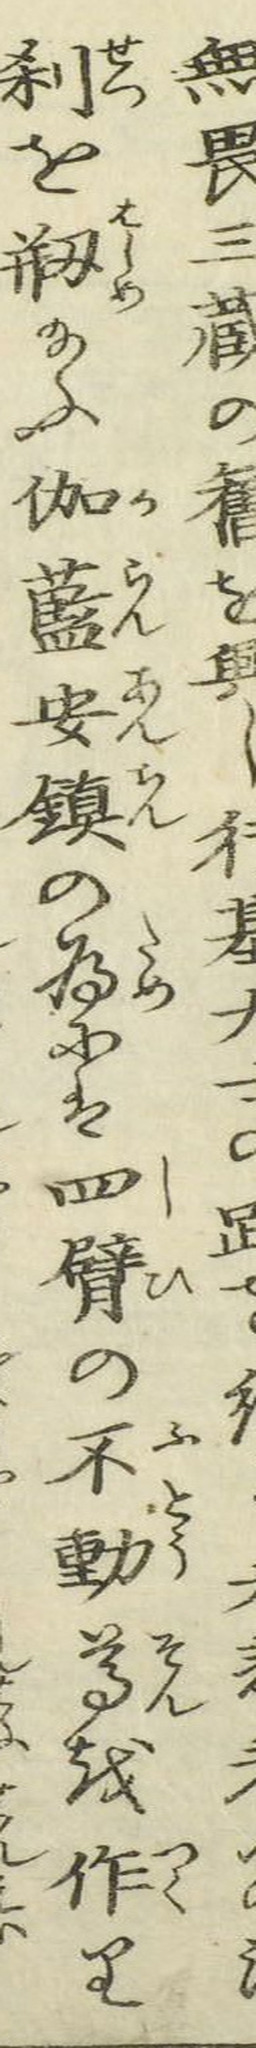刹を剏給ふ伽藍安鎮の為には四臂の不動尊を作り
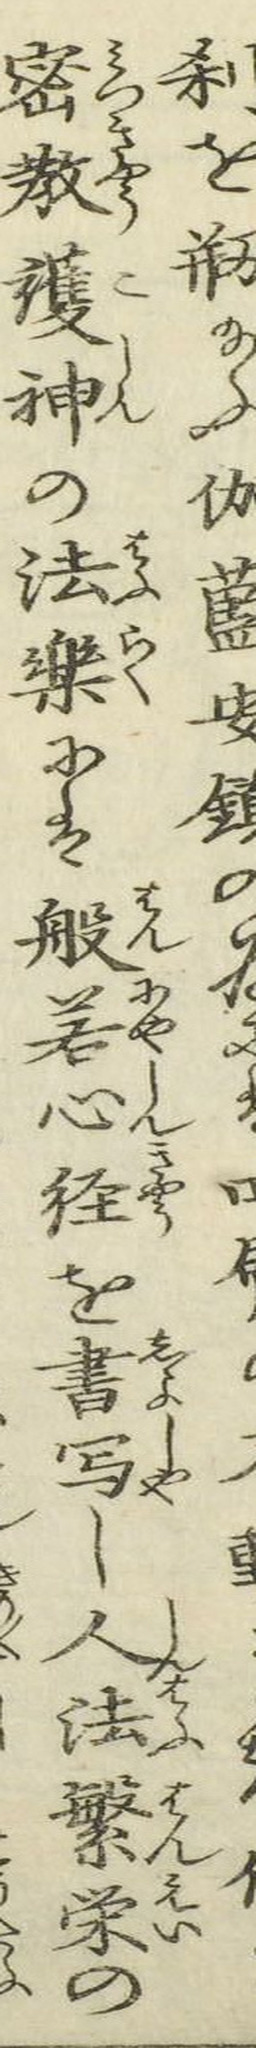密教護神の法樂には般若心経を書写し人法繁栄の
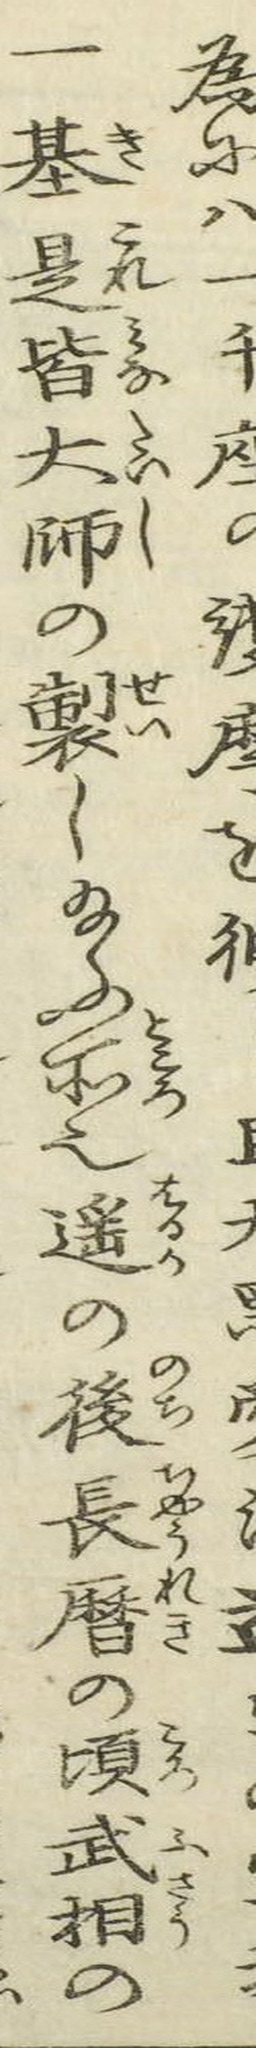一基是皆大師の製し給ふ所也遥の後長歷の頃武相の
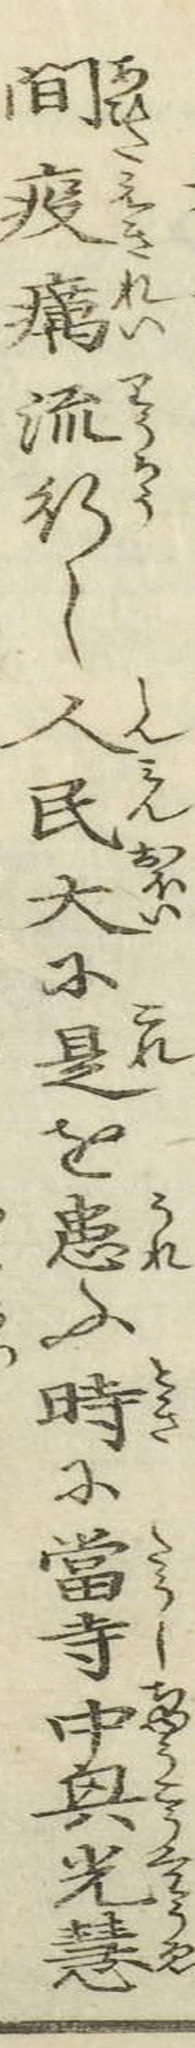間疫癘流行し人民大に是を患ふ當寺中興光慧
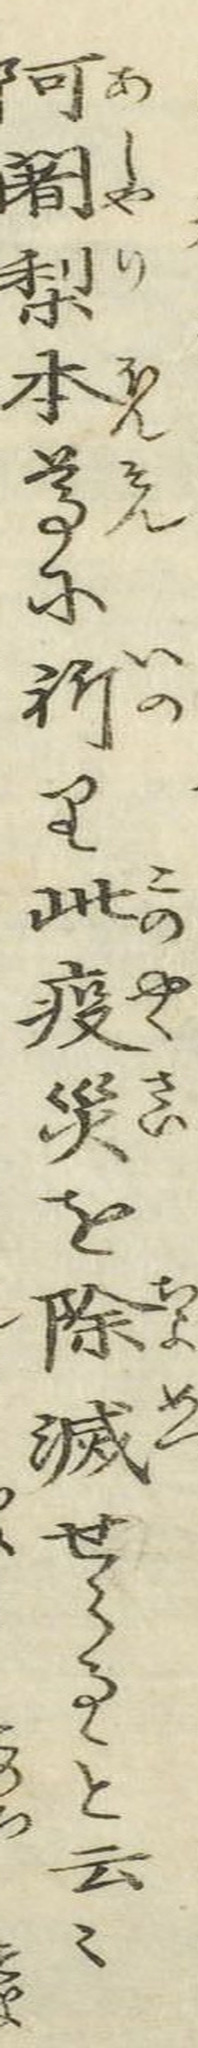阿闍梨本尊に祈り此疫災を除滅せらるゝと云々
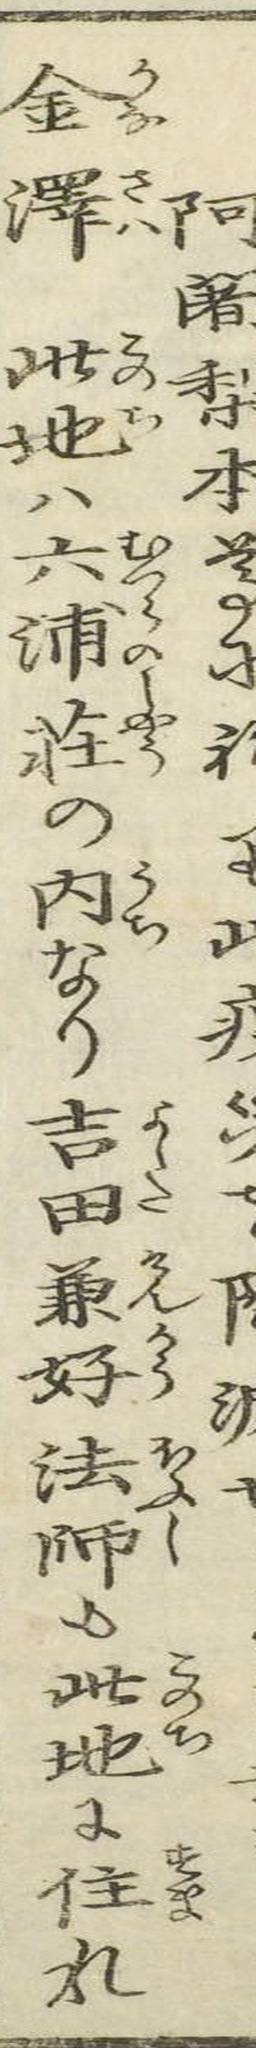金澤此地は六浦荘の内なり吉田兼好法師も此地に住れ
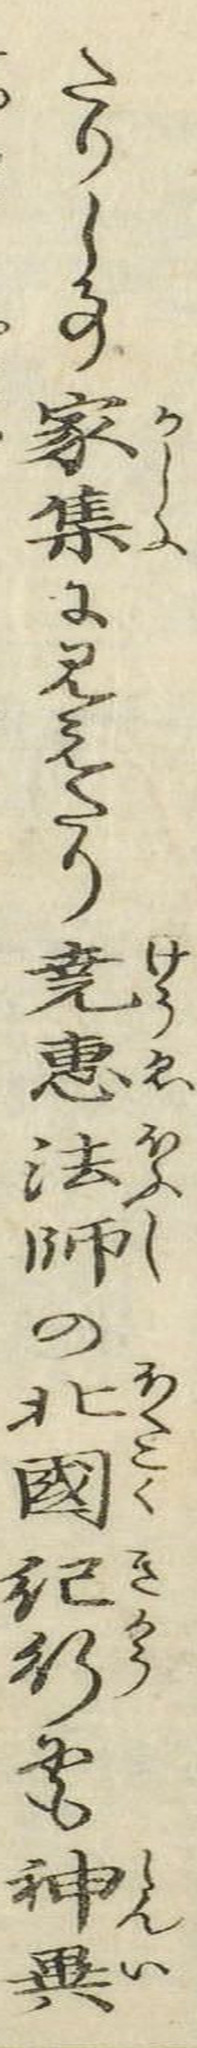たりし事家集に見えたり堯惠法師の北國紀行にも神異
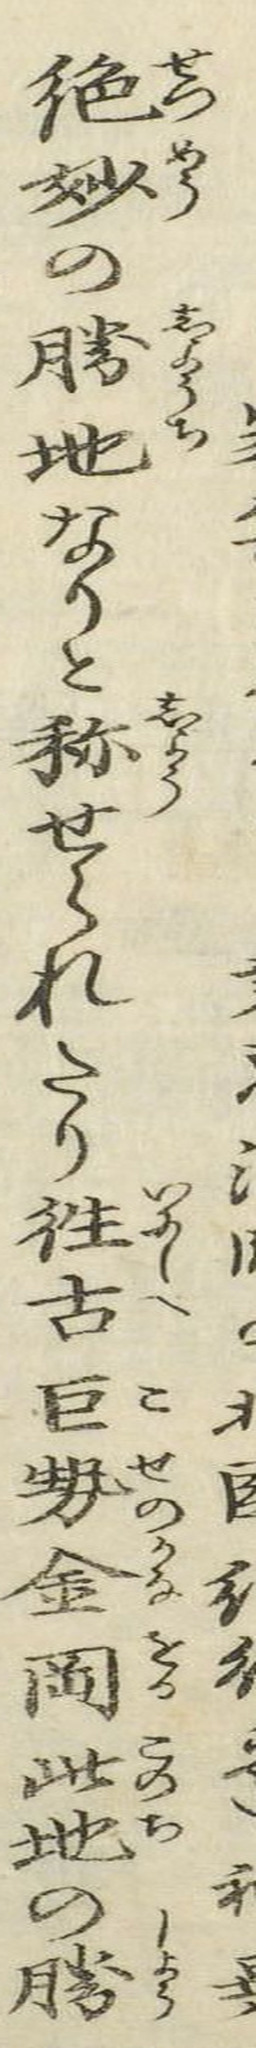絶妙の勝地なりと称せられたり往古巨㔟金岡此地の勝
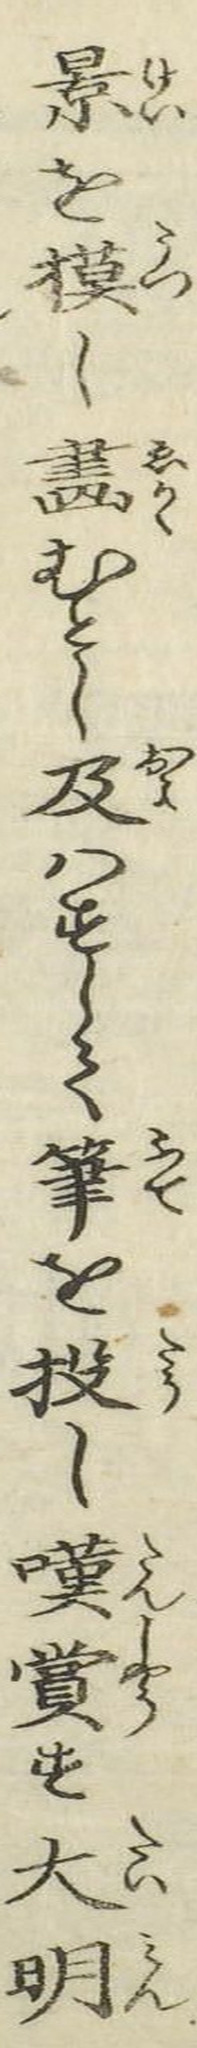景を摸し畫むとし及はすして筆を投し嘆賞す大明
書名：江戸名所図会 20巻 巻之6
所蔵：東京学芸大学教育コンテンツアーカイブ
